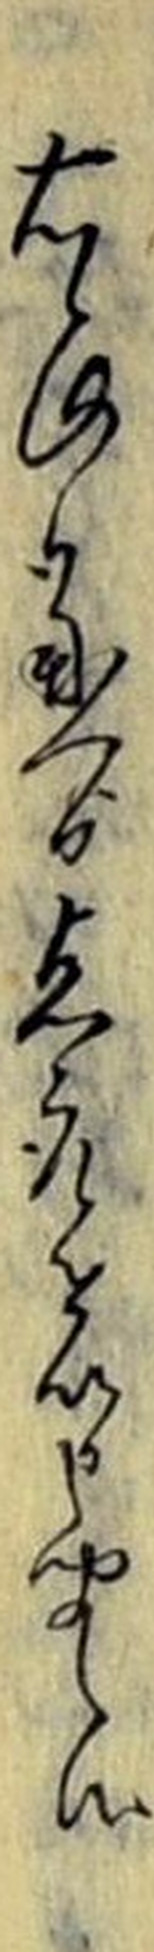右之趣御用人ゟ点取を以申聞候

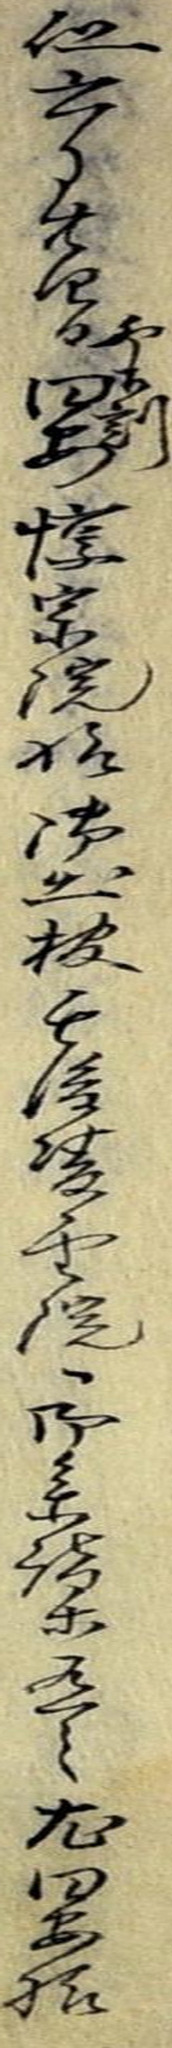但六月廿四日卯下刻田安惇宗院様御出棺其後凌雲院へ御参詣等有之尤田安様
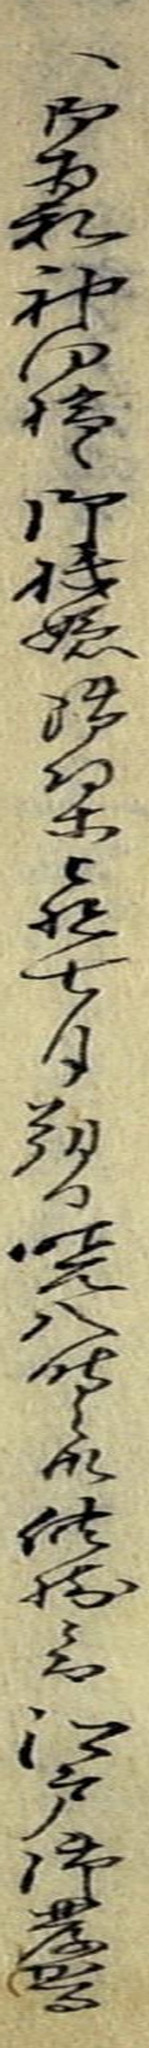へ御拝礼神田橋へ御機嫌御伺等被遊七月朔日暁八時之御供揃に而江戸御発駕
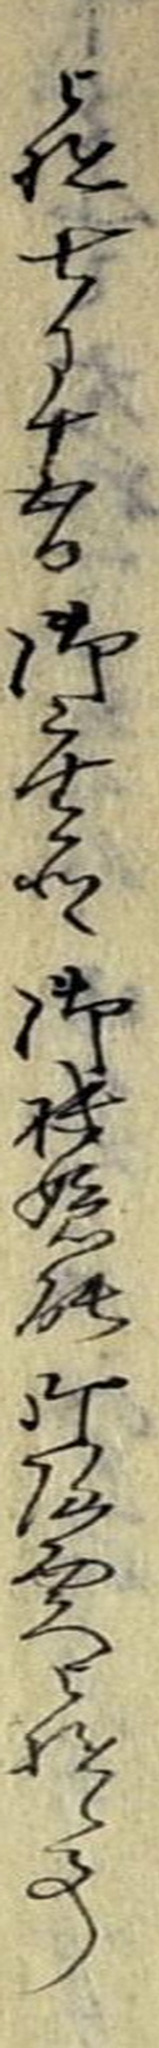被遊七月十五日御座所へ御機嫌能御帰殿被遊候事
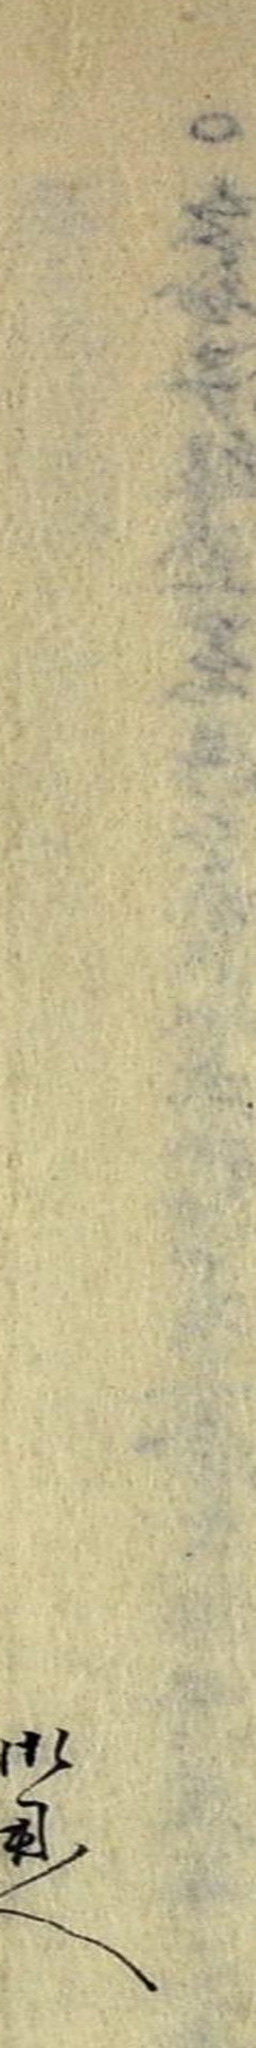御用人
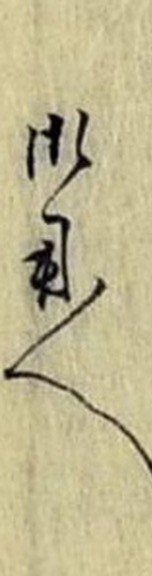御用人
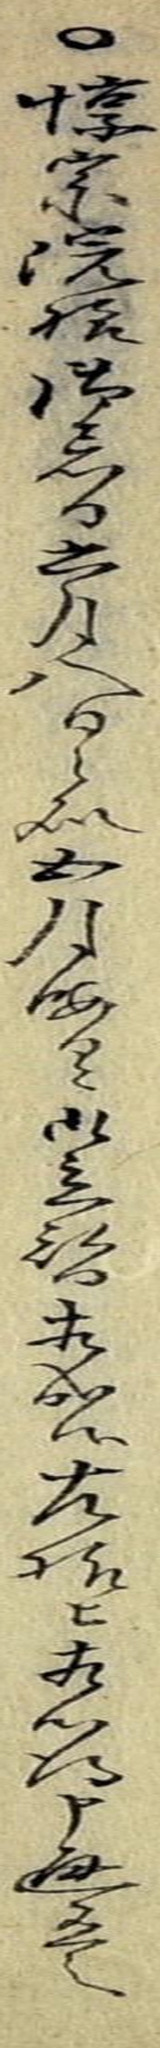○惇宗院様御忌日六月八日之処五月晦日に御立替相成候左様被相心得申通有之
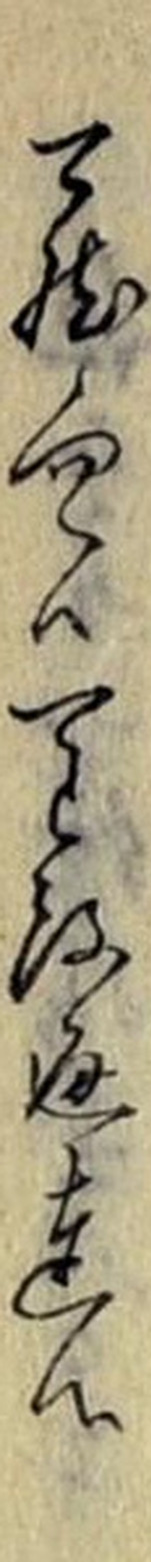可然向へは可被致通達候
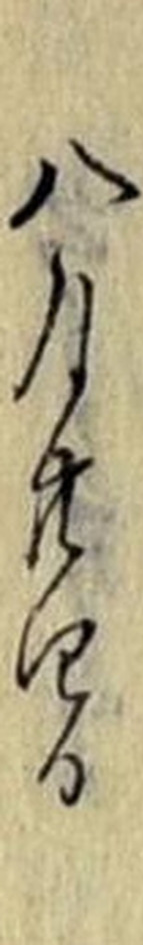八月廿四日
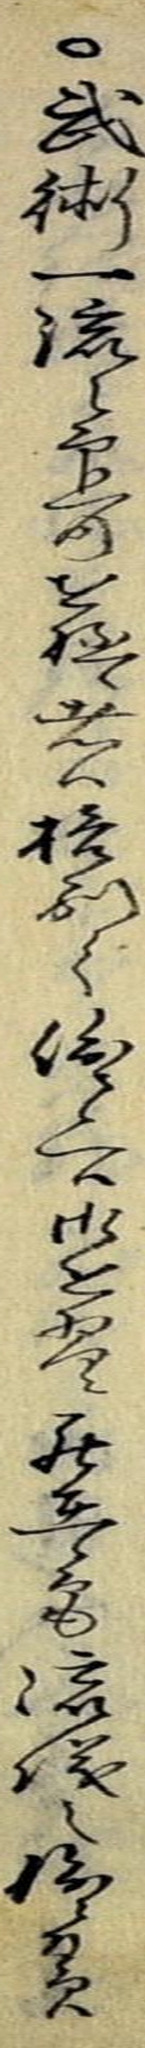○武術一流之印可を極候者は格別之儀に候へは御近習に罷在候而も流儀之儀に付而は
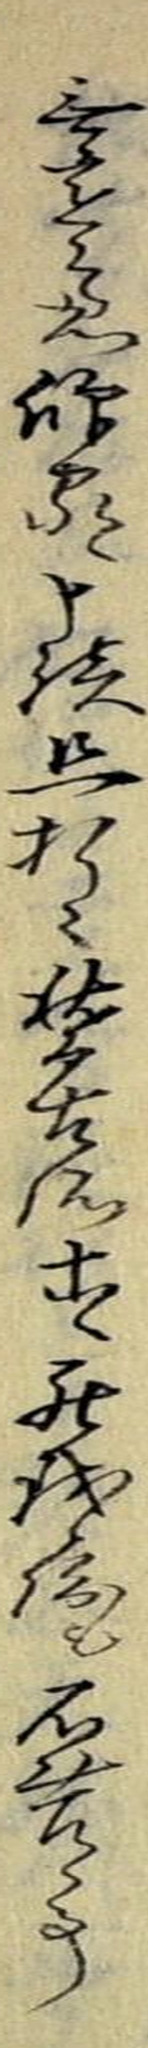無遠慮師家へ申談且折々稽古所等へ罷越候儀も不苦候事
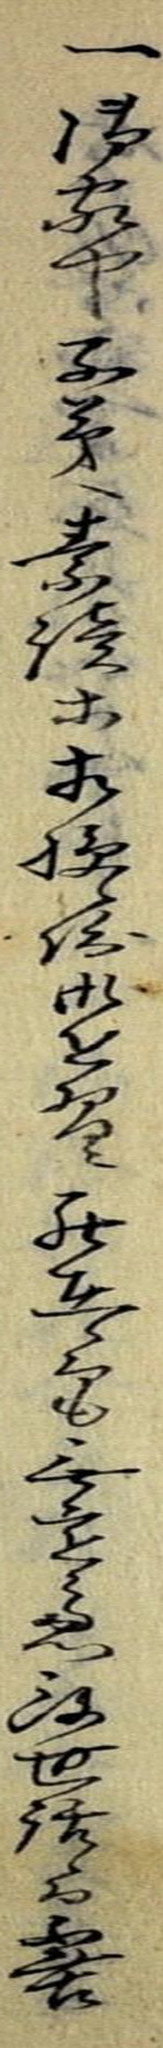一御家中子弟へ素読等相授候儀御近習に罷在に而も無遠慮致世話候而不苦
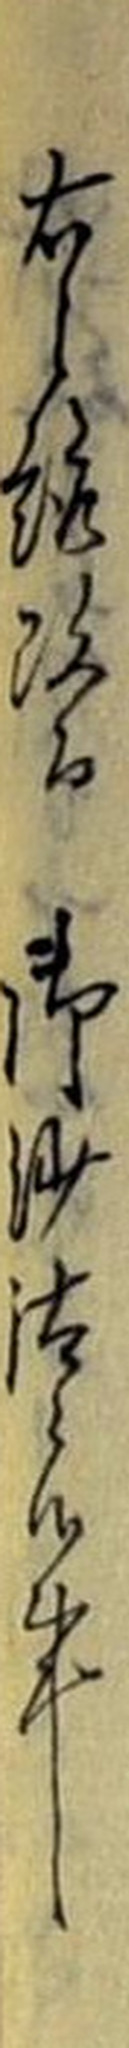右之趣改而御沙汰に候事
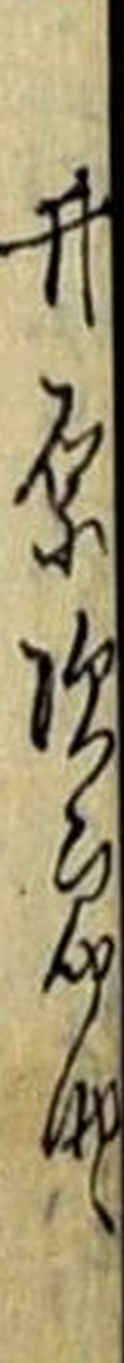井原次郎助
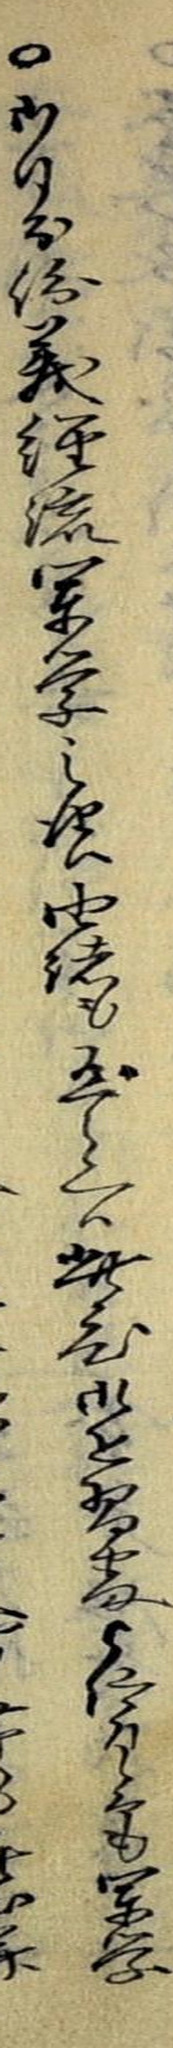○御自分儀義経流軍学之儀は由緒も有之候へは此度御近習番被仰付候而も軍学
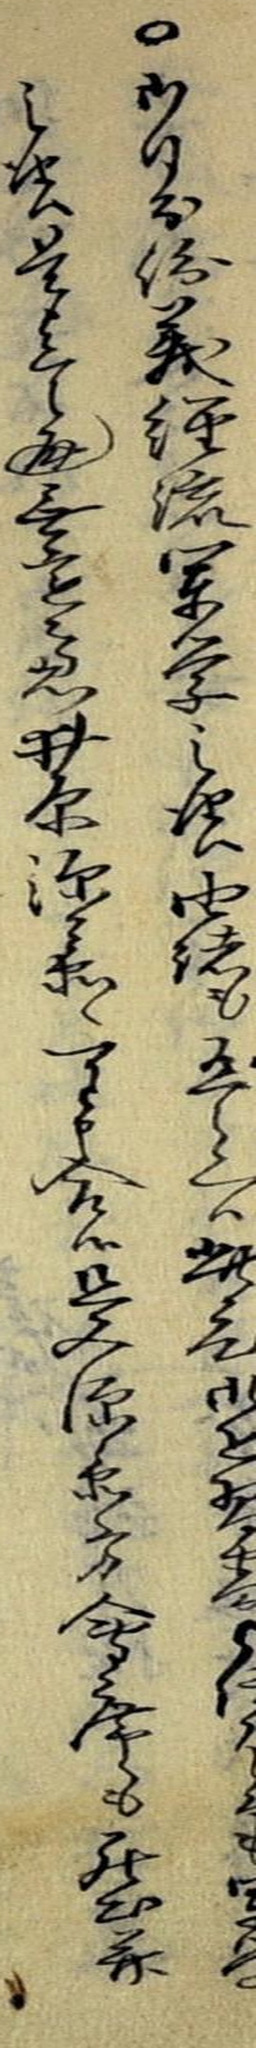之儀は是迄之通無遠慮井原源兵衛へ可被申合候且又源兵衛方会席へも罷出井
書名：命令之部 六
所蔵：福井県文書館 Fukui Prefectural Archives
